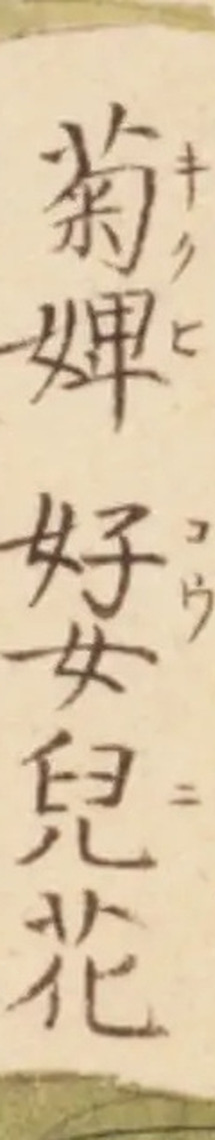菊婢好女児花
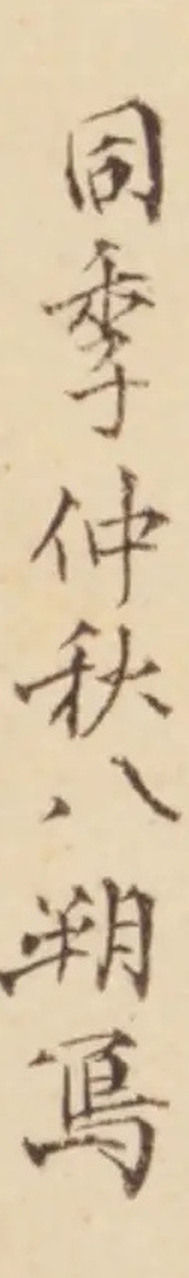同季仲秋八朔写

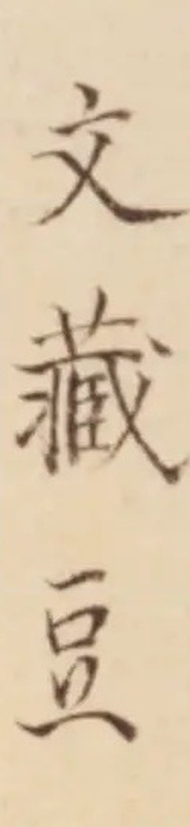文蔵豆
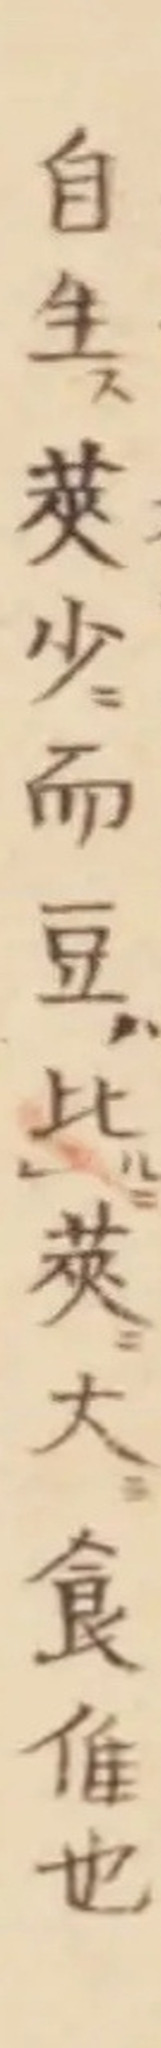自生莢少而豆比莢大食倠也
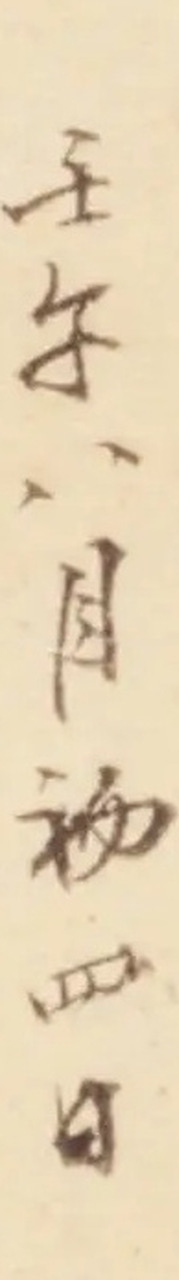壬午八月四日
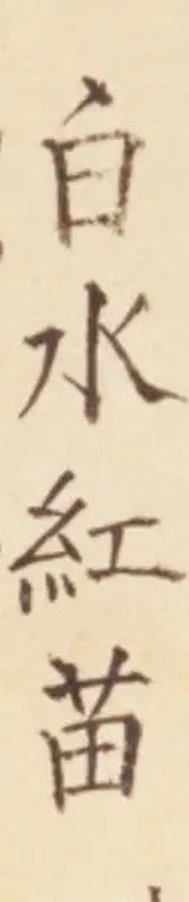白水紅苗
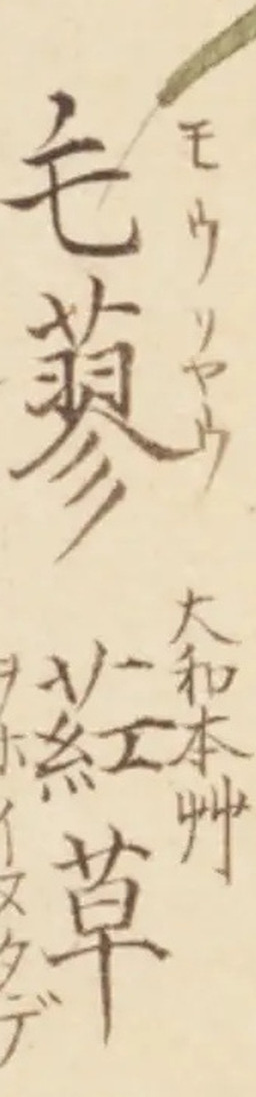毛蓼葒草
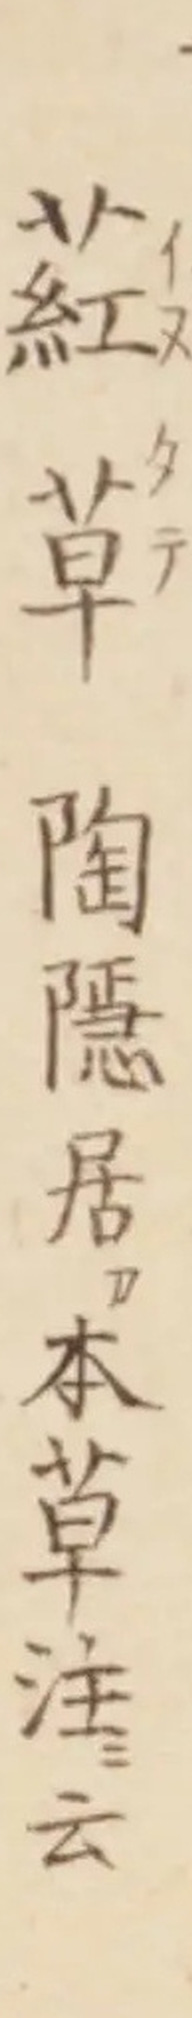葒草陶隠居本草注云
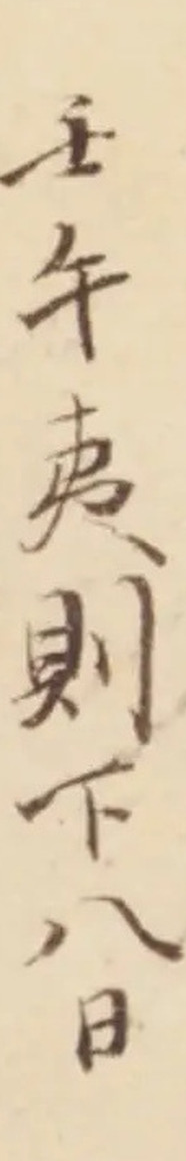壬午夷則下八日
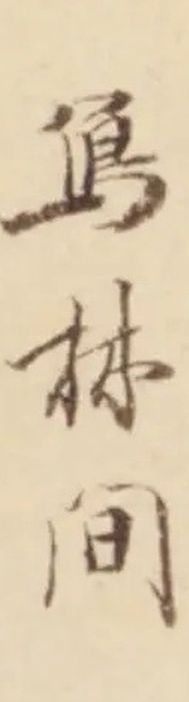写林間

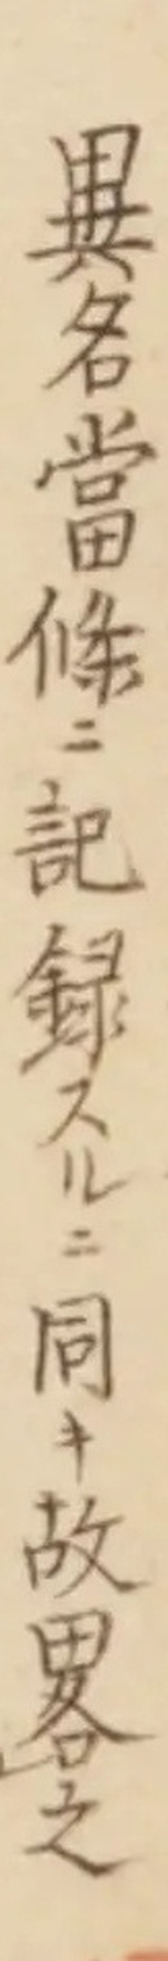異名当条ニ記録スルニ同キ故略之
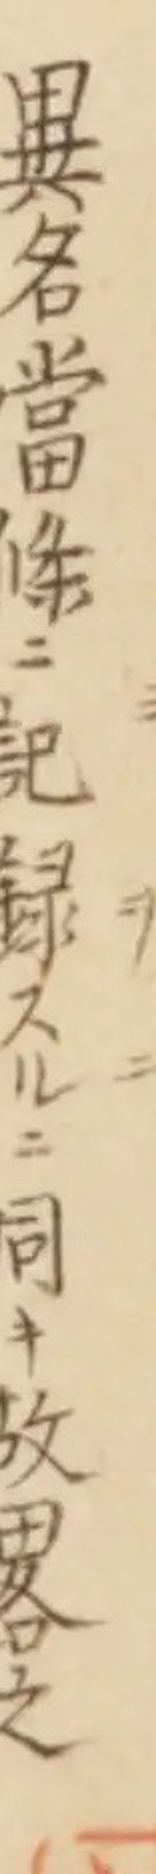異名当条ニ記録スルニ同キ故略之
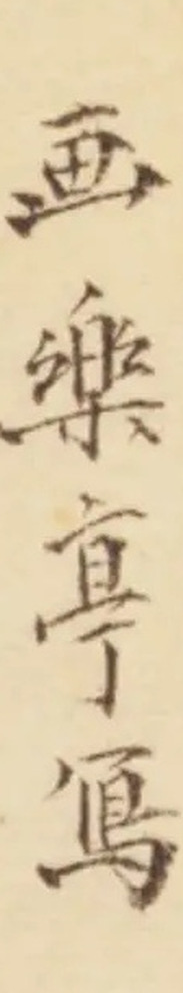画楽亭写

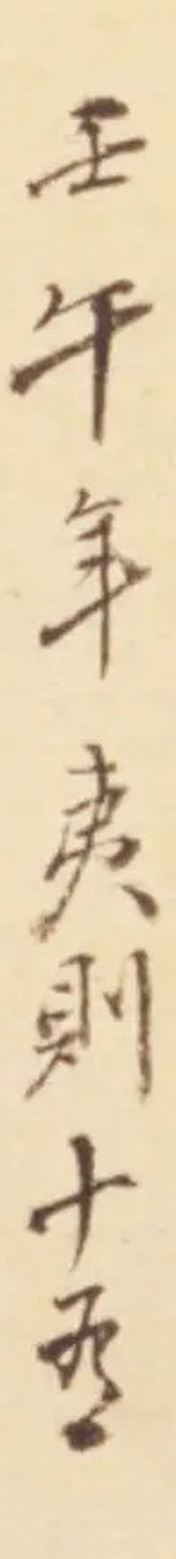壬午年夷則十有
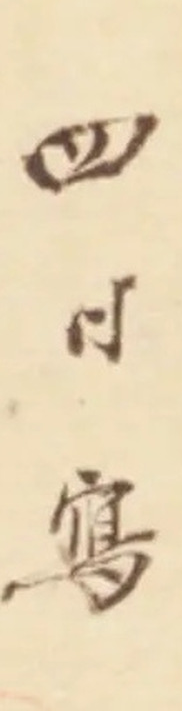四日写
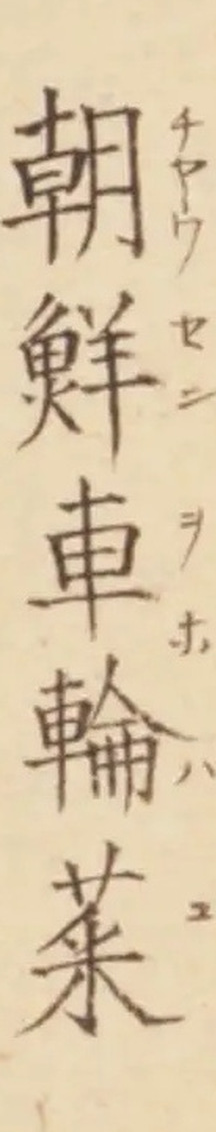朝鮮車輪菜
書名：梅園草木花譜秋之部. 1
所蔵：国立国会図書館 National Diet Library, JAPAN
